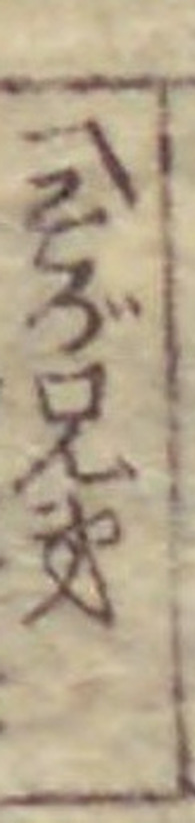〽そが兄弟
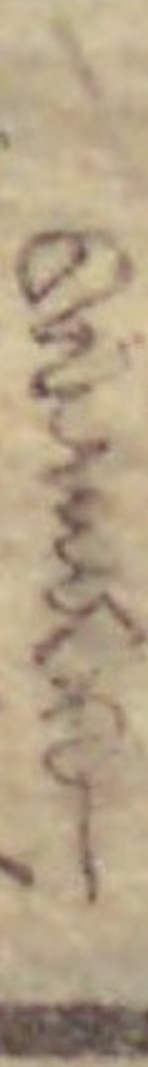のぞみはなし
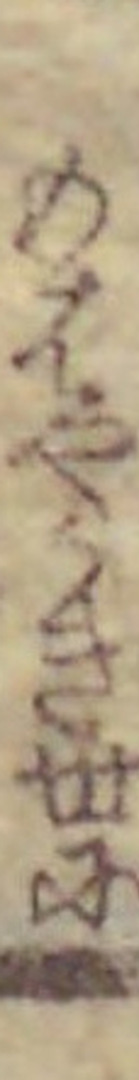もはやうき世に
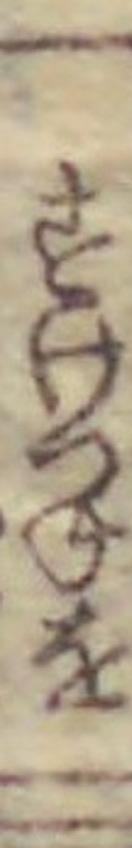すけつねを
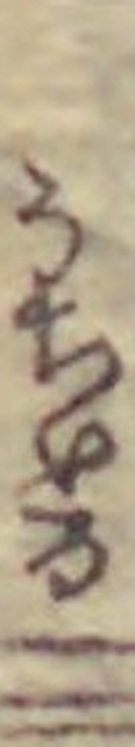うちとる
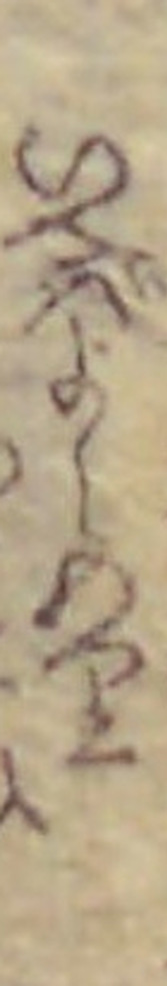いへばよしもり
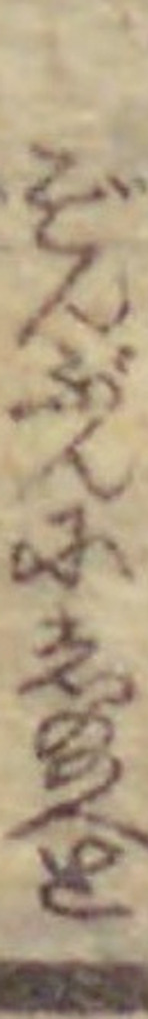ぞんぶんにし給へと
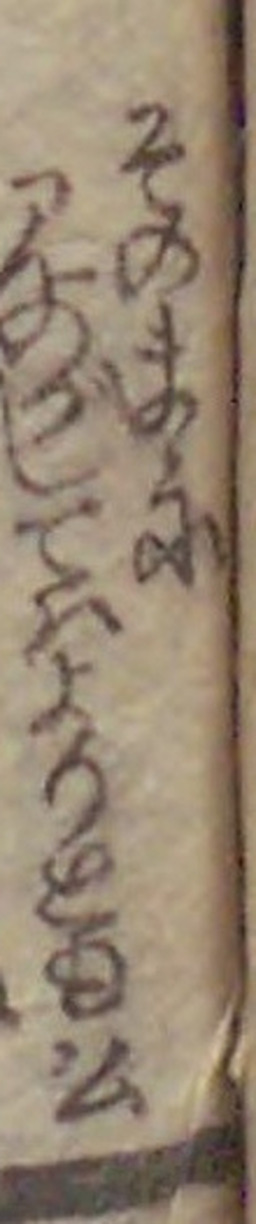見のがしてはよりとも公
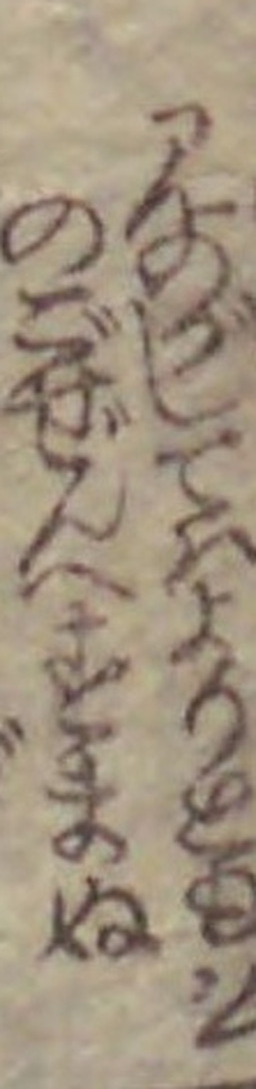のごぜんへすまぬ
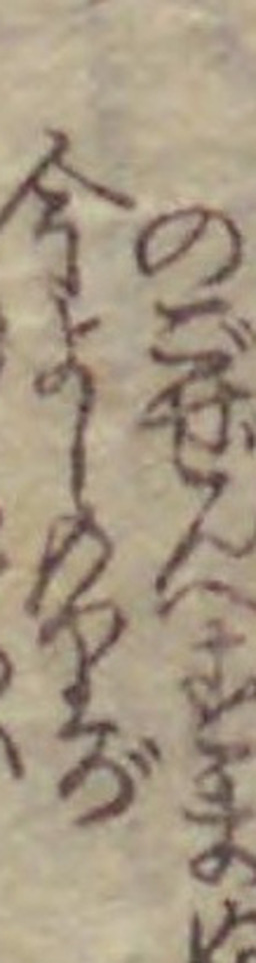今よいもりが
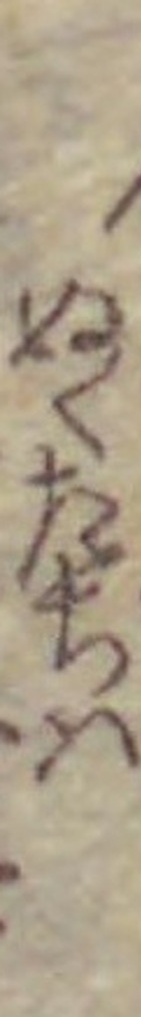ぬくたちは
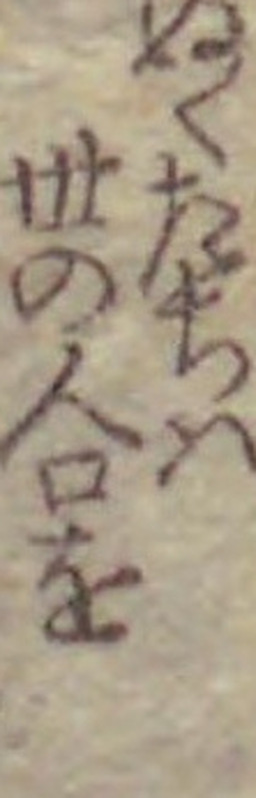世の人口を
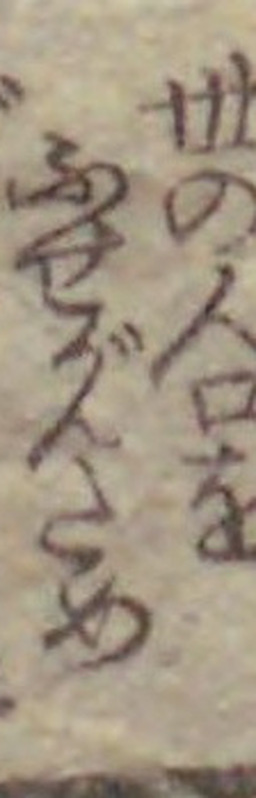ふせがんため
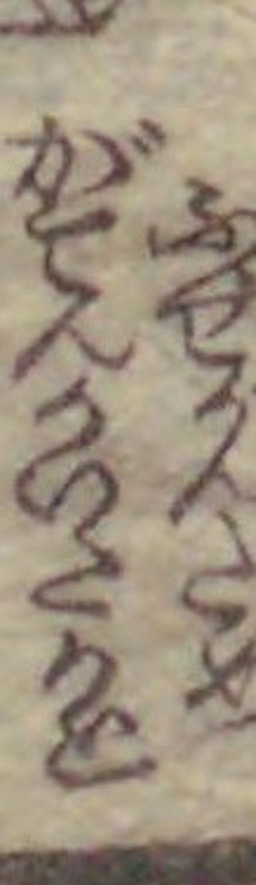がてんかいたかと
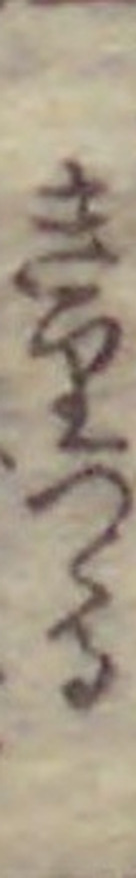きりつくる
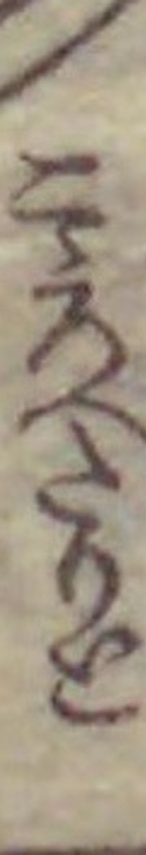こゝろへたりと
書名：大時代唐土化物 3巻. 曽我太夫染
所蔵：国立国会図書館 National Diet Library, JAPAN
